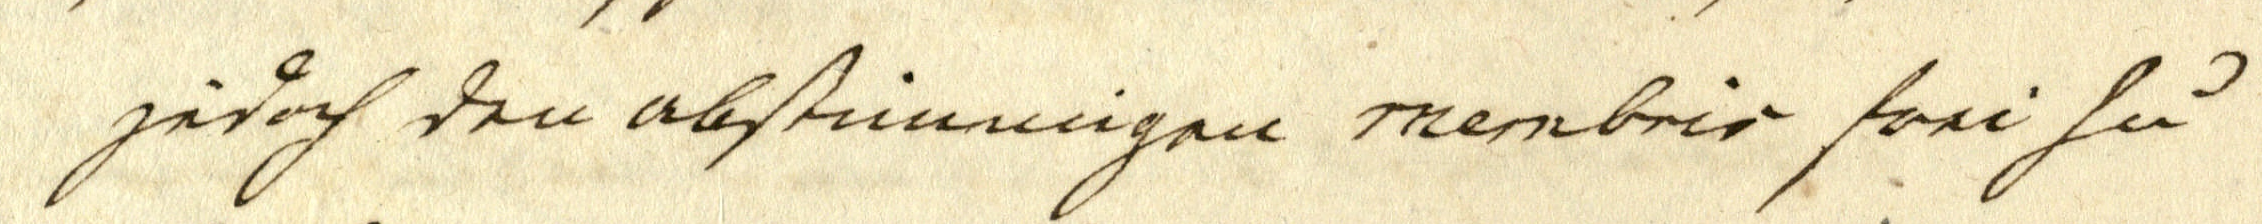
jedoch den abstimmigen membris frei zu
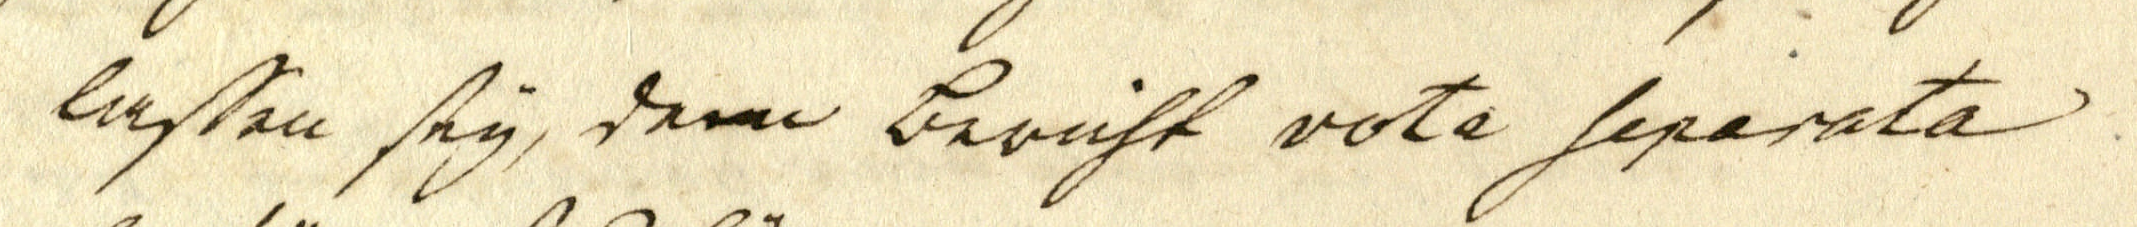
lassen seÿ, dem Bericht vota separata
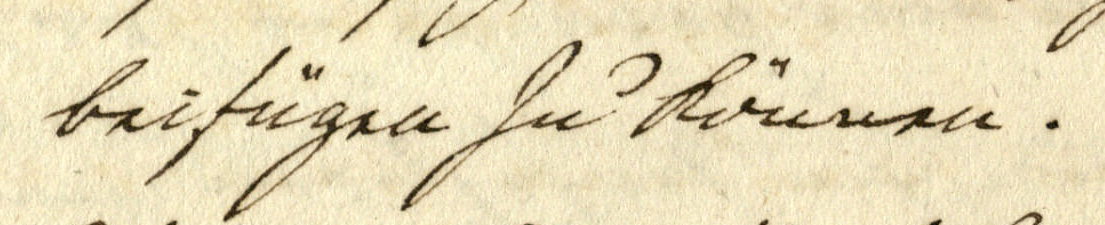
beifügen zu können.
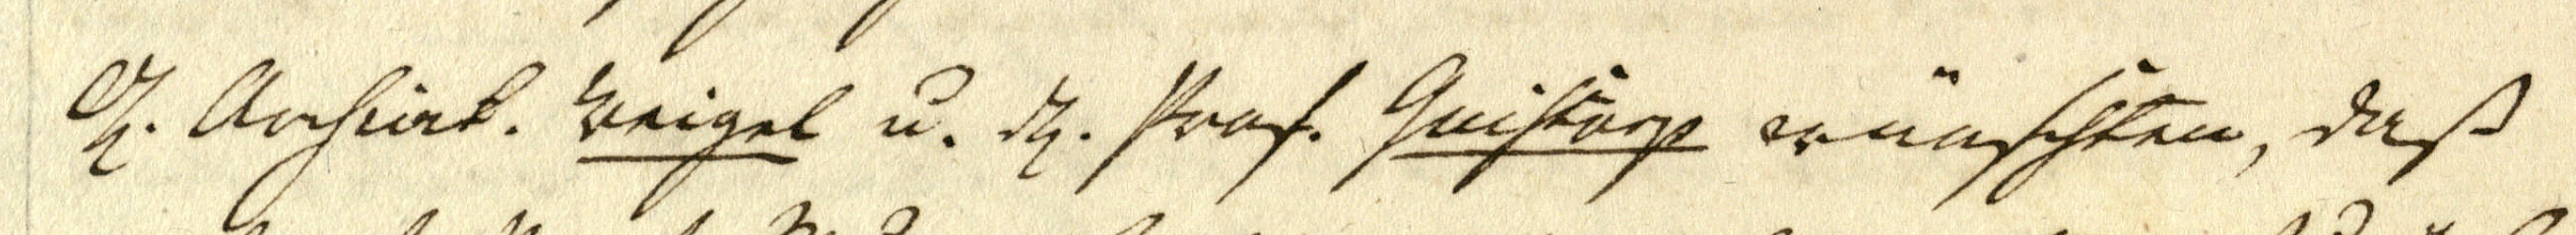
dh. Archiat. Weigel u. dh. Prof. Quistorp wünschten, daß
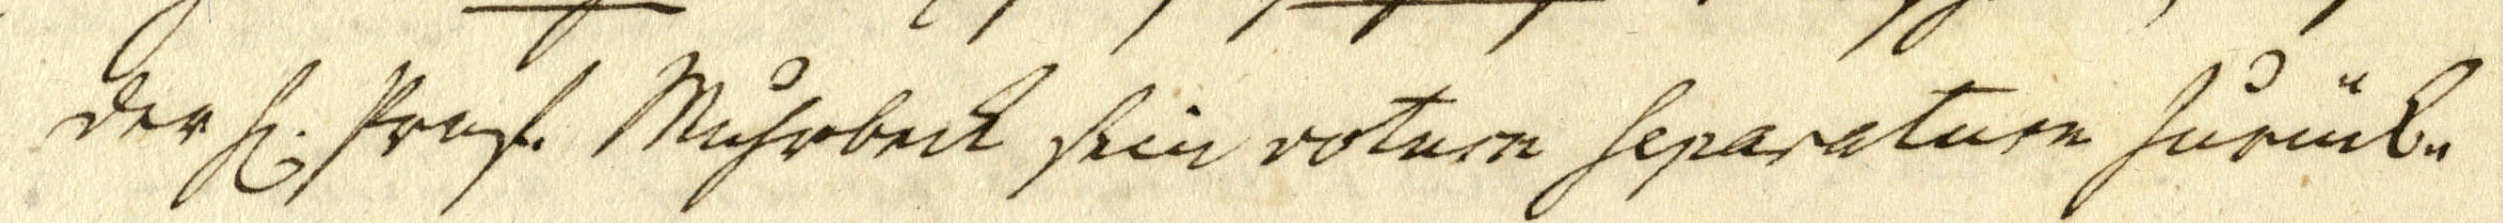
der h. Prof. Muhrbeck sein votum separatum zurück¬
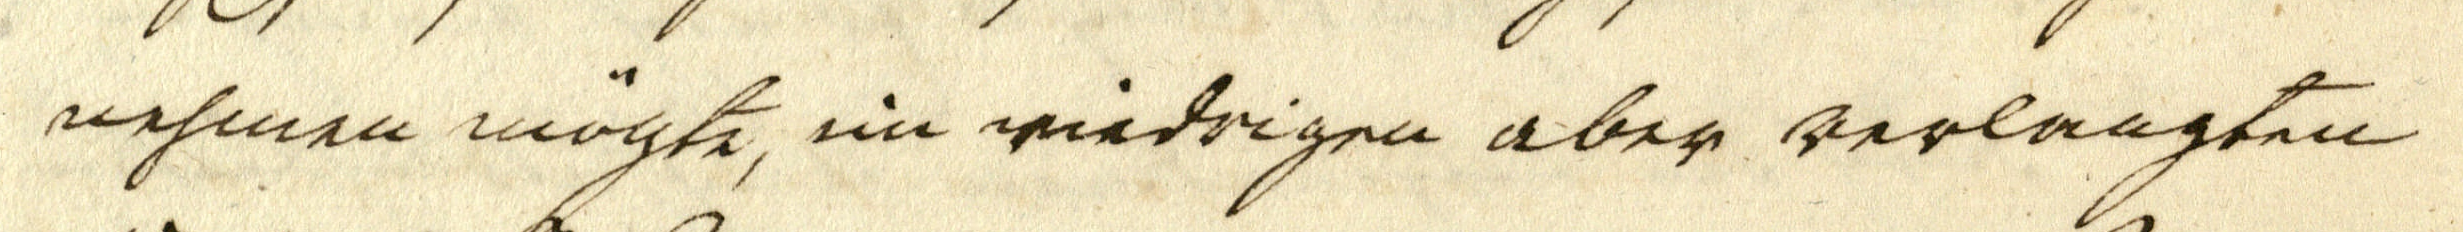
nehmen mögte, im wiedrigen aber verlangten
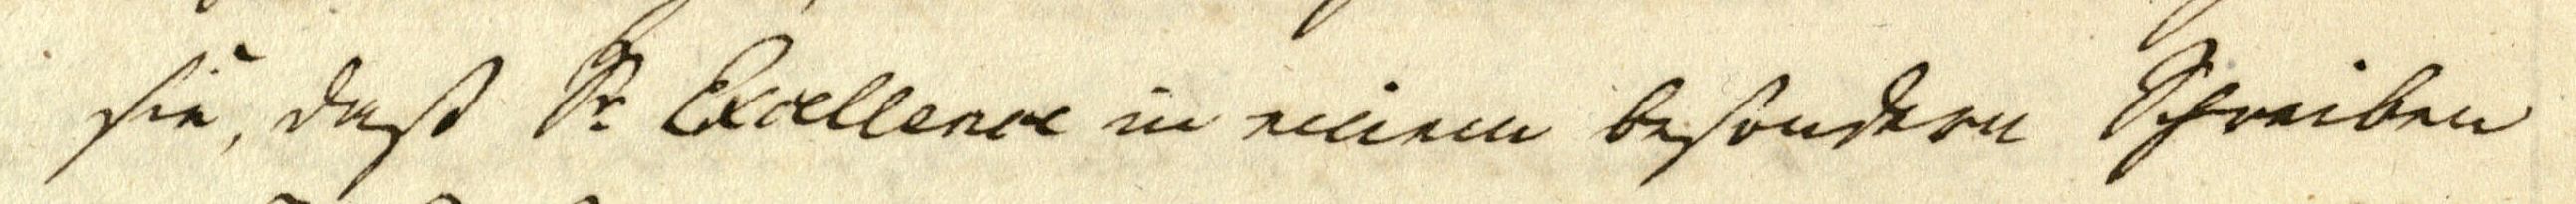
sie, daß Sr. Excellence in einem besondern Schreiben
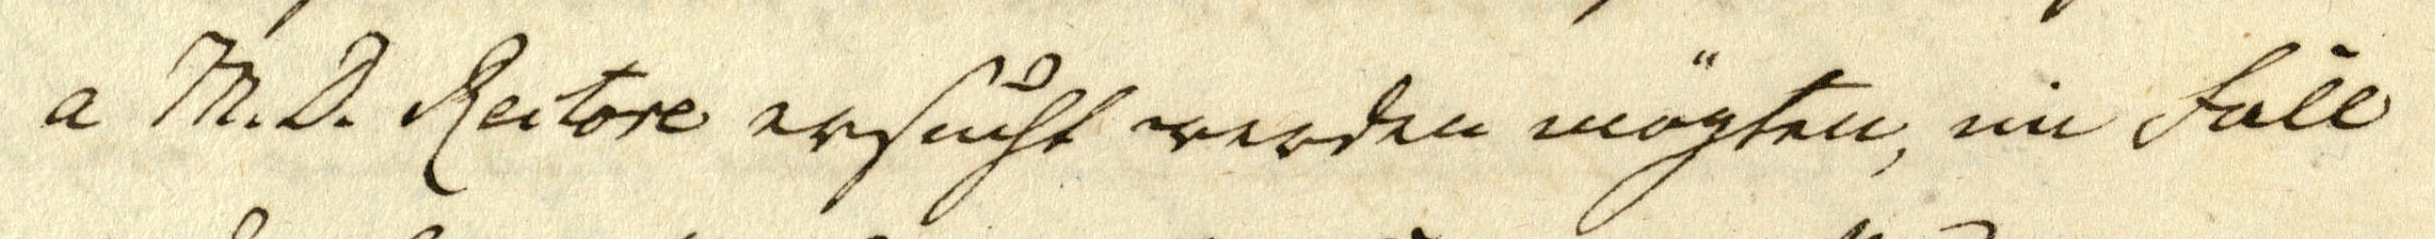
a M. D. Rectore ersucht werden mögten, im Fall
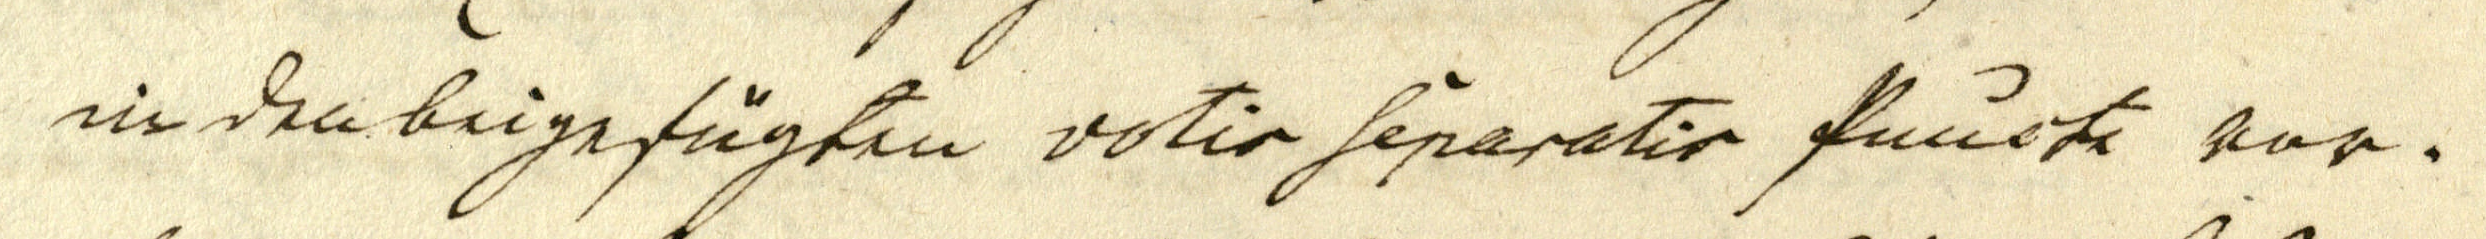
in den beigefügten votis separatis Puncte vor¬
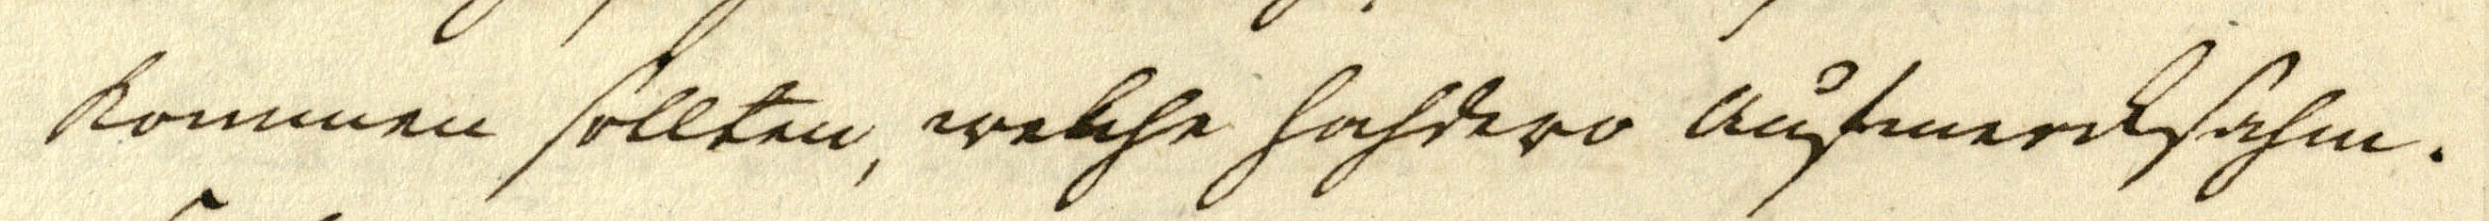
kommen sollten, welche hochdero Aufmerksahm¬
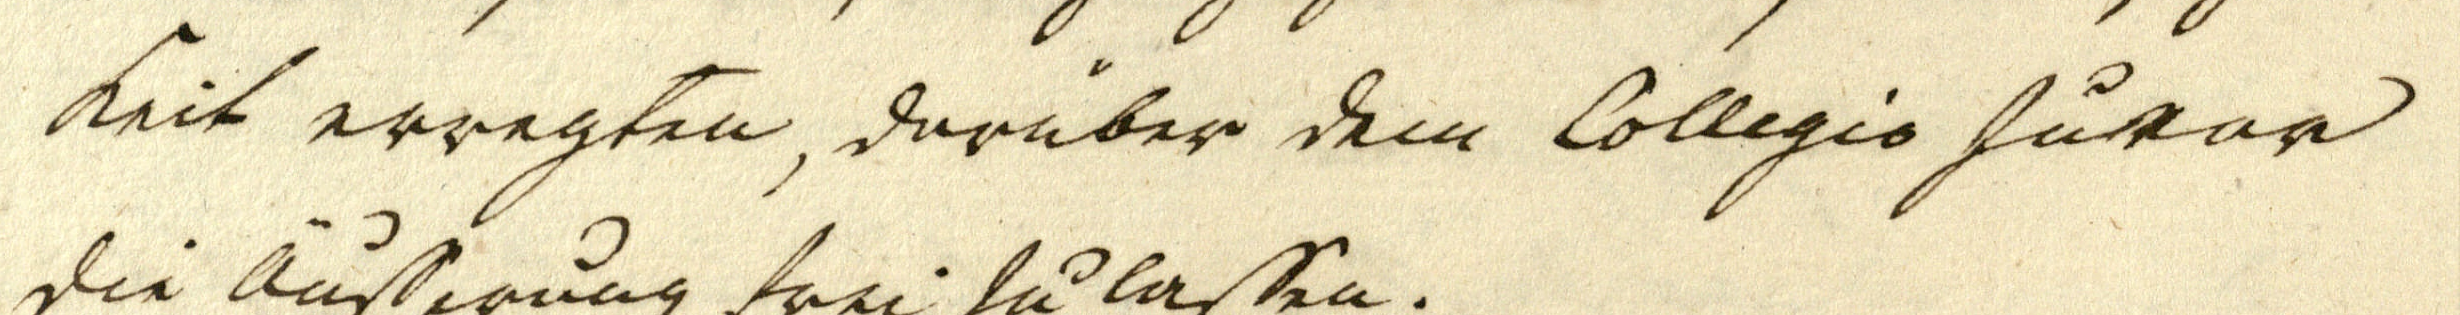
keit erregten, darüber dem Collegio zuvor
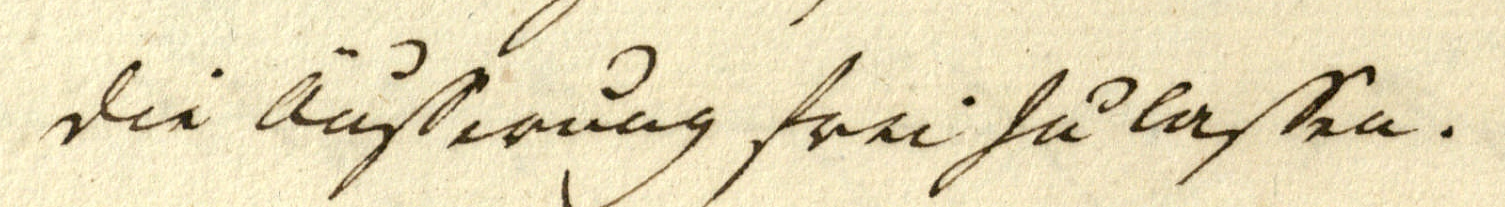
die Äusserung frei zu lassen.
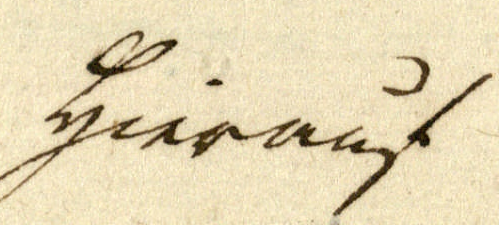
Hierauf
